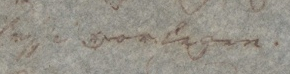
ausschusse vorlegen.
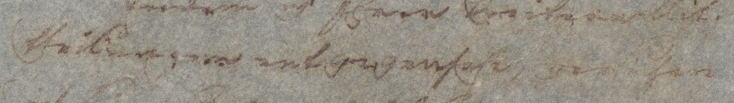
theilungen entgegensehe, versichere
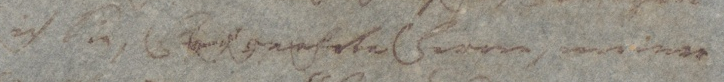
ich Sie, hochgeehrte Herren, meiner
